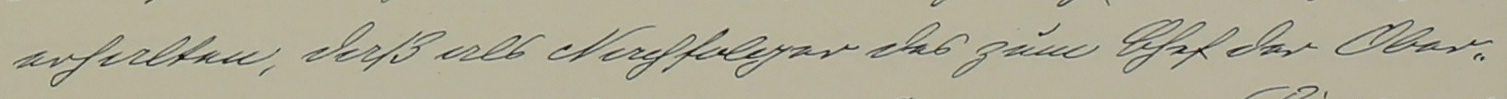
erhalten, daß als Nachfolger des zum Chef der Ober-
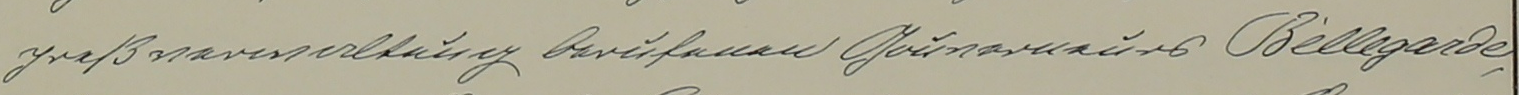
preßverwaltung berufenen Gouverneurs Bellegarde
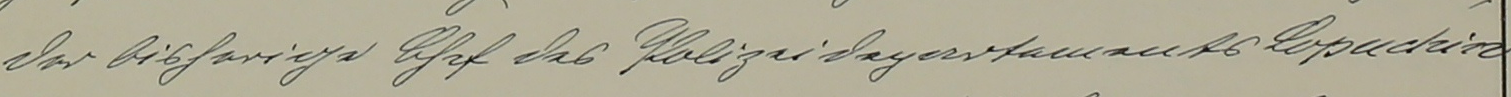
der bisherige Chef des Polizeidepartements Lopuchin
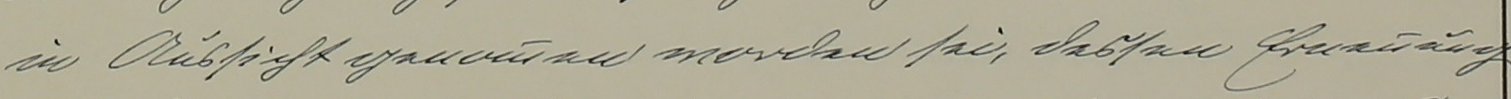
in Aussicht genommen worden sei, dessen Ernennung
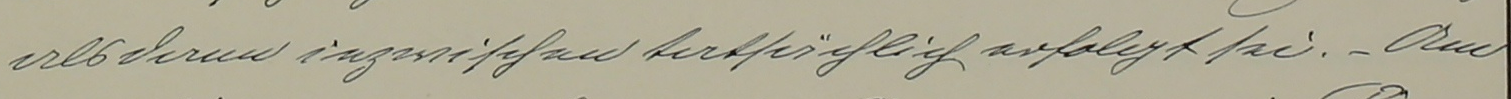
alsdann inzwischen tatsächlich erfolgt sei. – Am
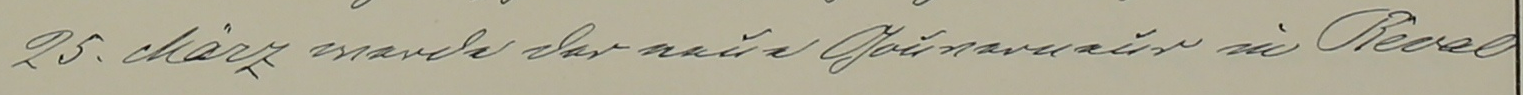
25. März werde der neue Gouverneur in Reval
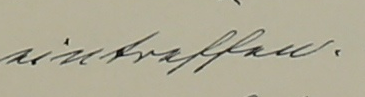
eintreffen.
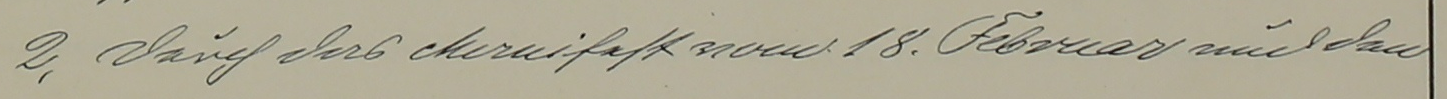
2. Durch das Manifest vom 18. Februar und den
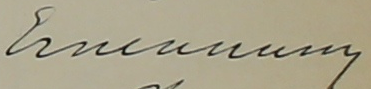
Ernennung
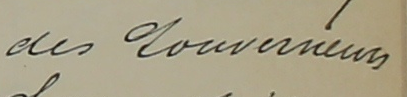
des Gouverneurs
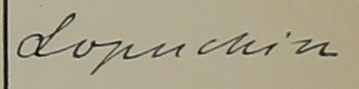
Lopuchin
